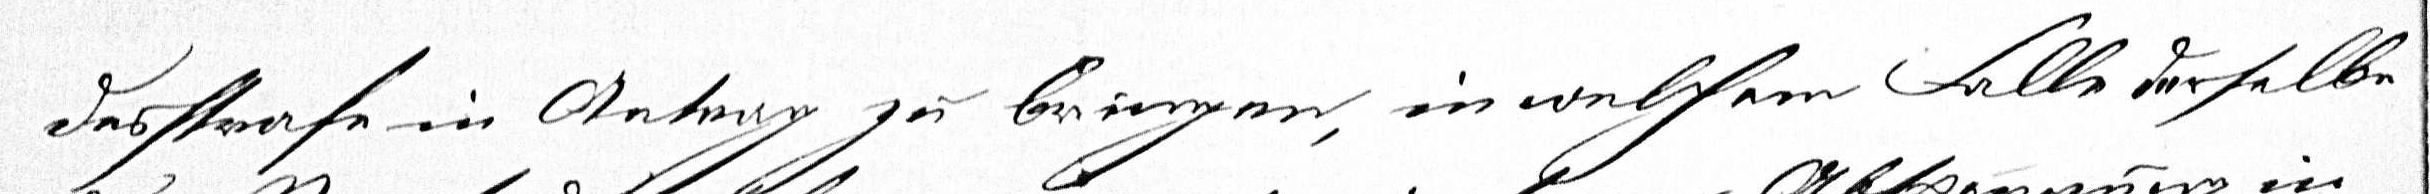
desstrafe in Antrag zu bringen, in welchem Falle derselbe
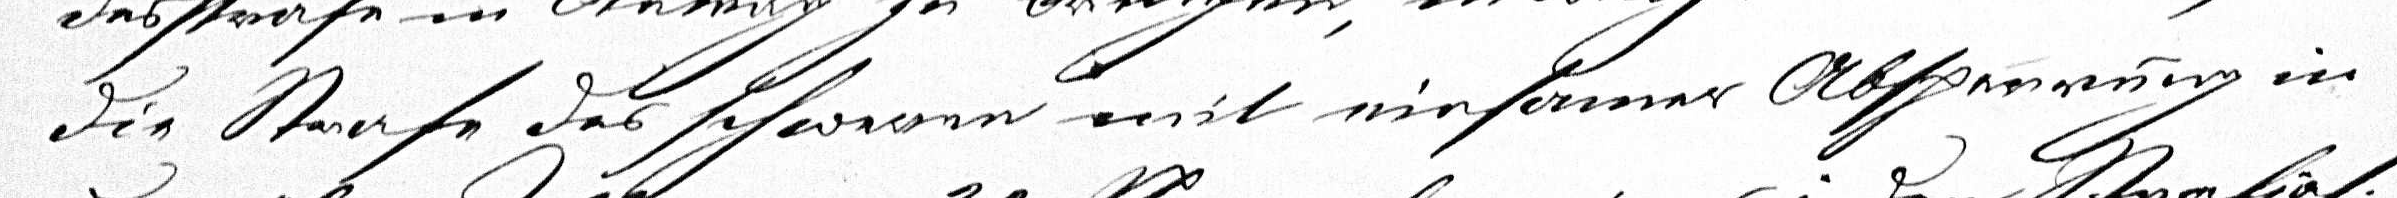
die Strafe des schweren mit einsamer Absperrung in
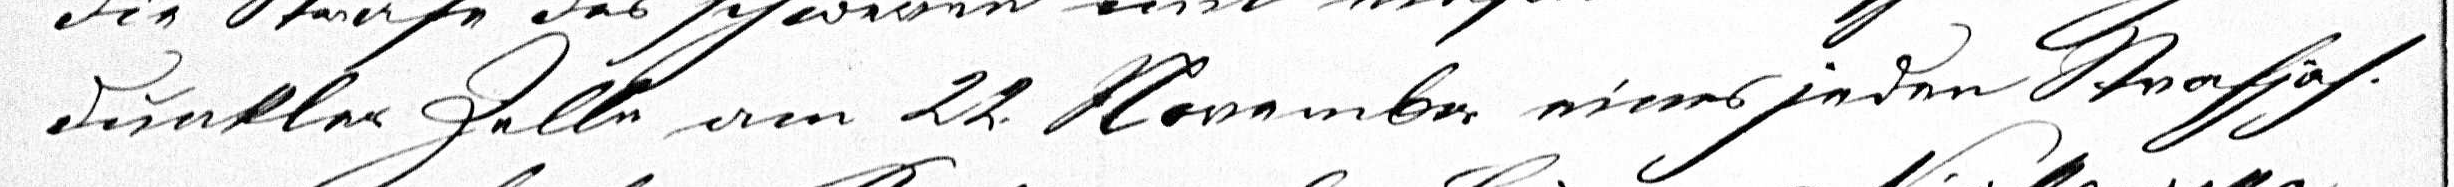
dunkler Zelle am 22. November eines jeden Strafjah¬
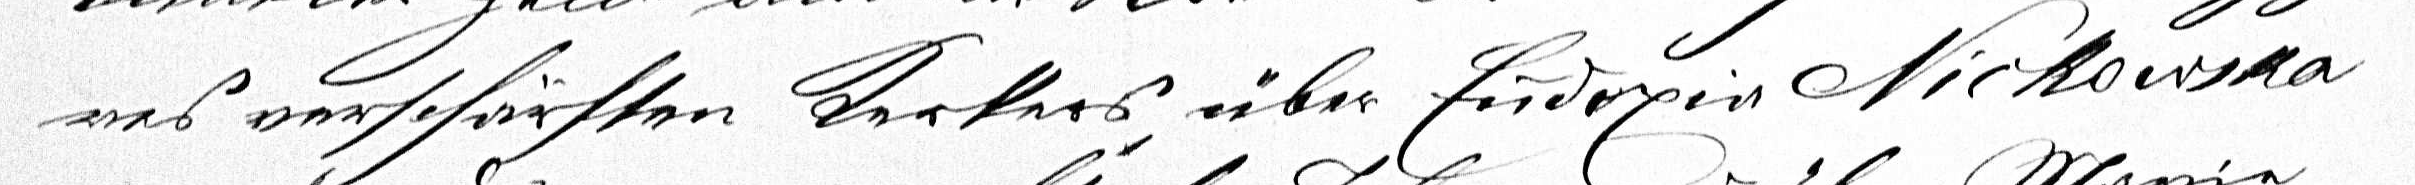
res verschärften Kerkers über Eudoxia Nickowska
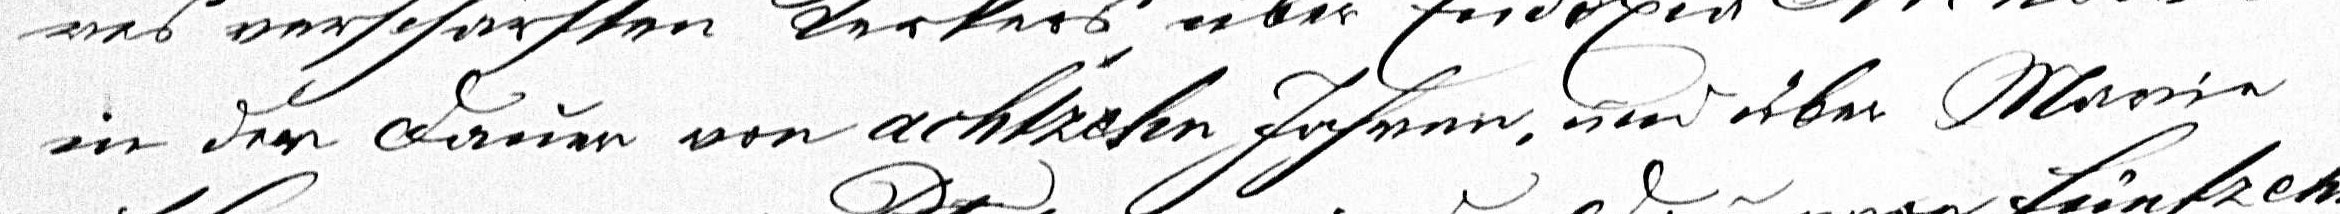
in der Dauer von achtzehn Jahren und über Marie
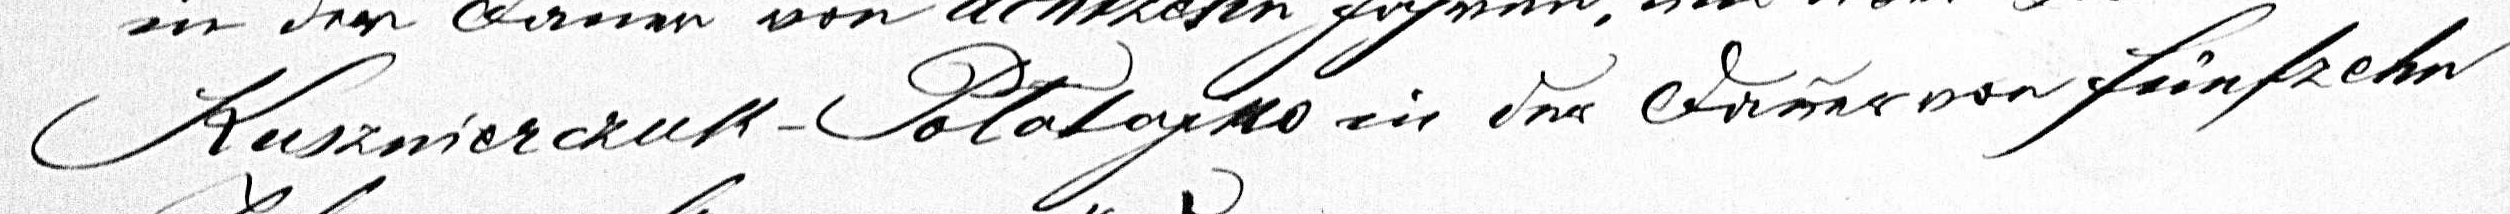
Kusznierczuk- Połatajko in der Dauer von fünfzehn
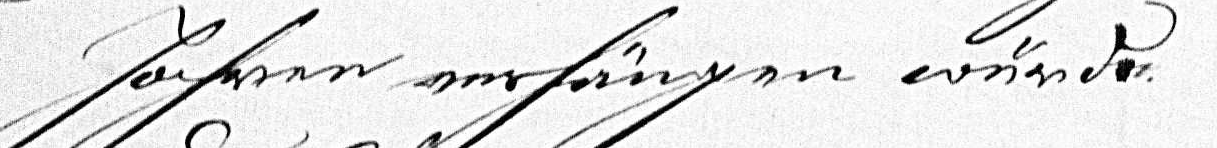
Jahren verhängen würde.
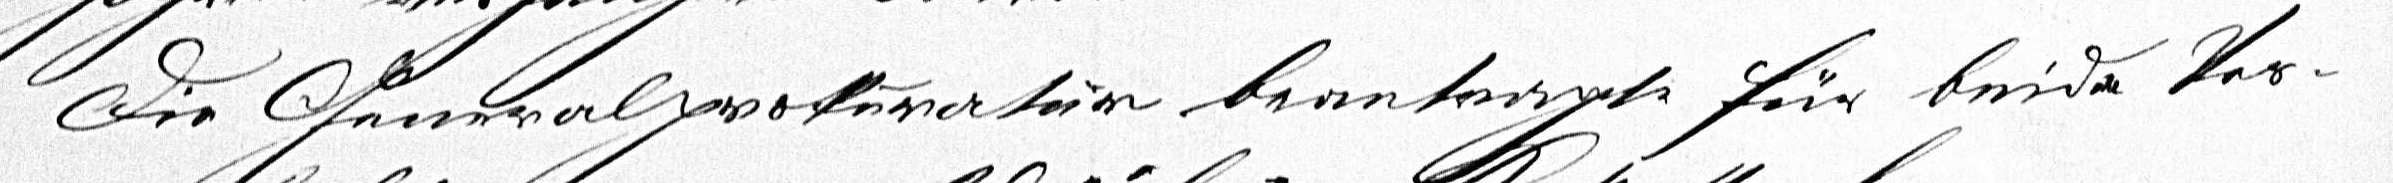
Die Generalprokuratur beantragte für beide Ver¬
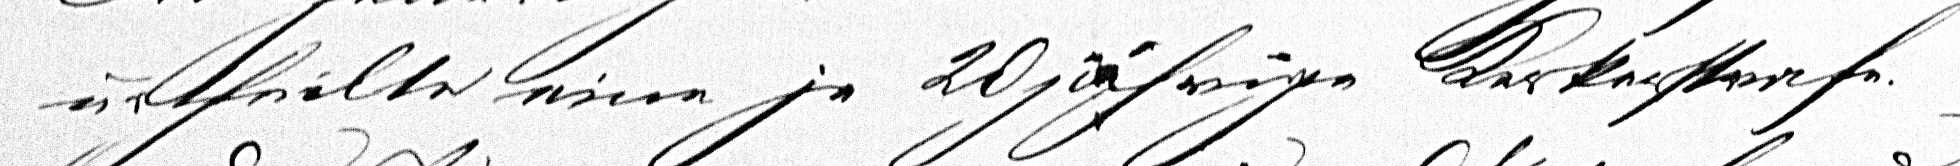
urtheilte eine je 20jährige Kerkerstrafe.
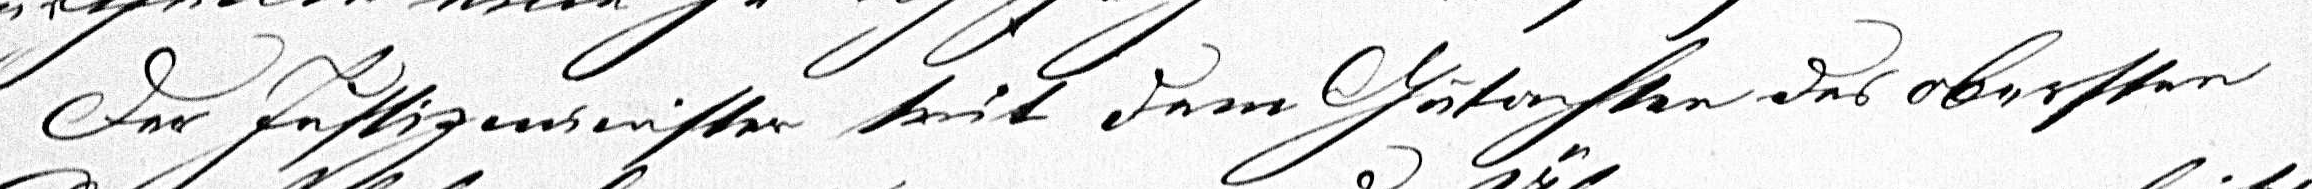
Der Justizminister trit dem Gutachten des obersten
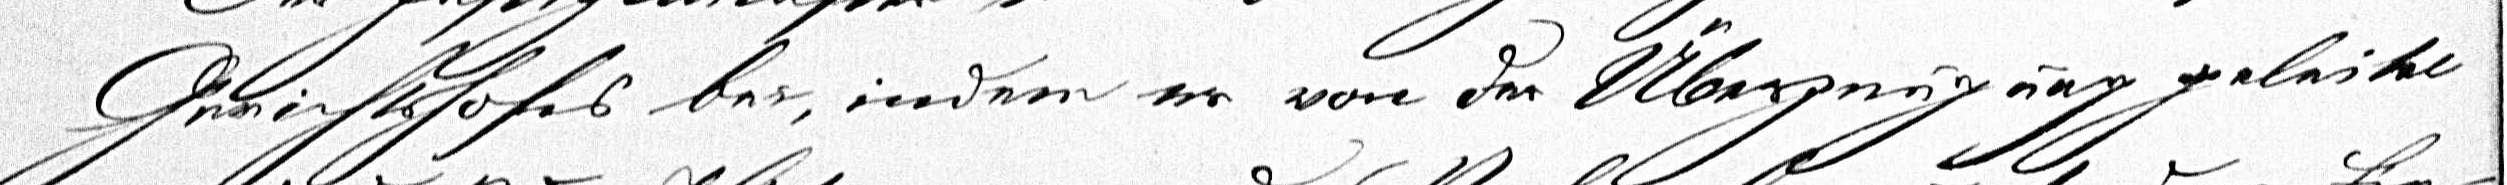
Gerichtshofes bei, indem er von der Überzeugung geleitet
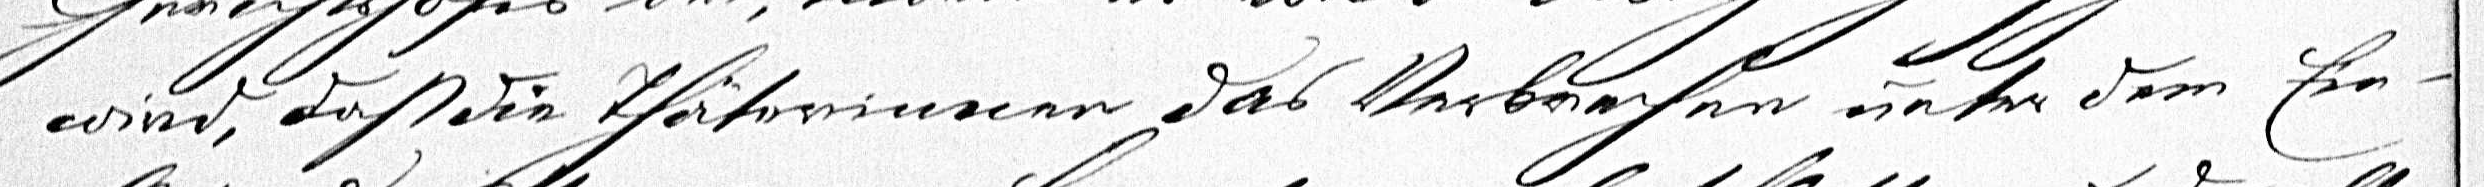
wird, daß die Thäterinnen das Verbrechen unter dem Ein¬
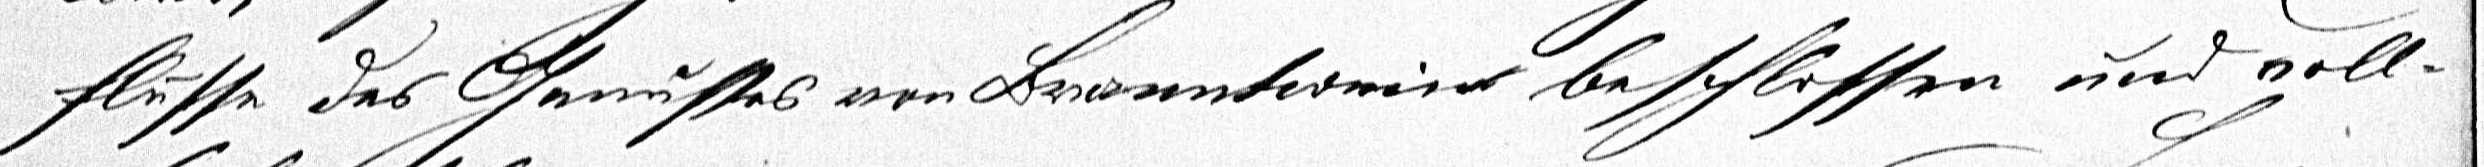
flusse des Genußes von Branntwein beschlossen und voll¬
